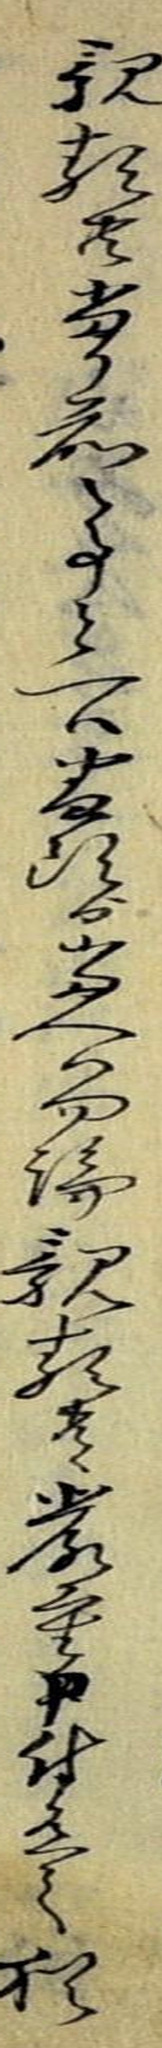親類共当り前之事に候へは番頭ゟ当人は勿論親類共へ厳重申付有之猶
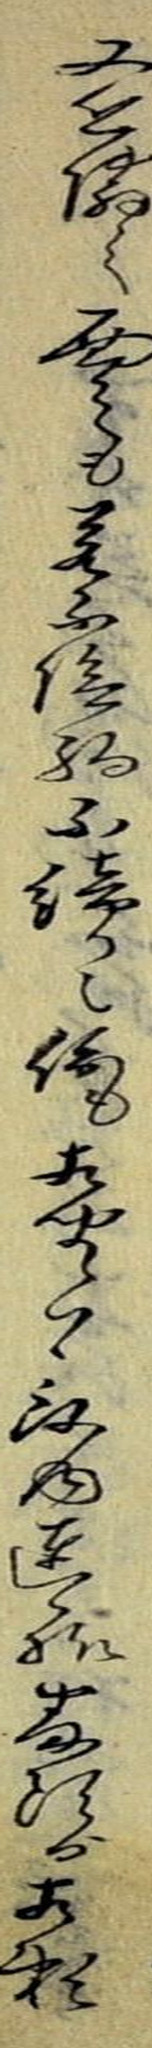又近隣の面々も若不倹約不締り之儀も相聞候はヽ致内達候様番頭ゟ相頼
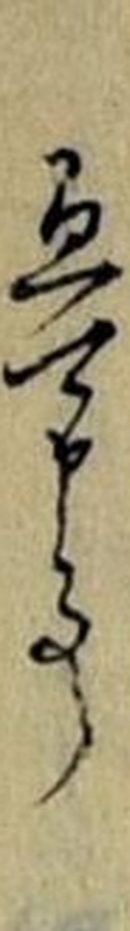置可申事
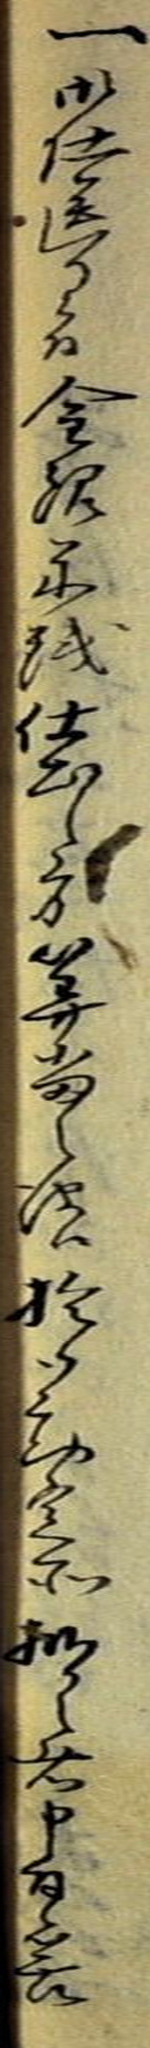一御仕送りに付金銀米銭仕出し方算当之儀は於御勘定所掛り之者申付候筈
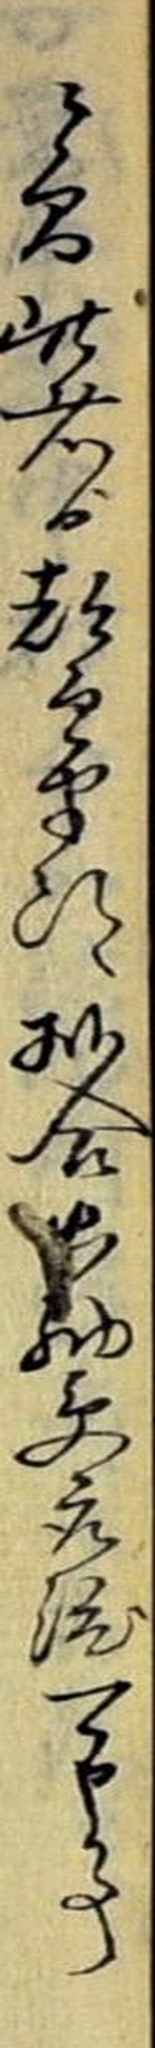に候間此者ゟ都而筆頭へ掛合出納受取渡可申事
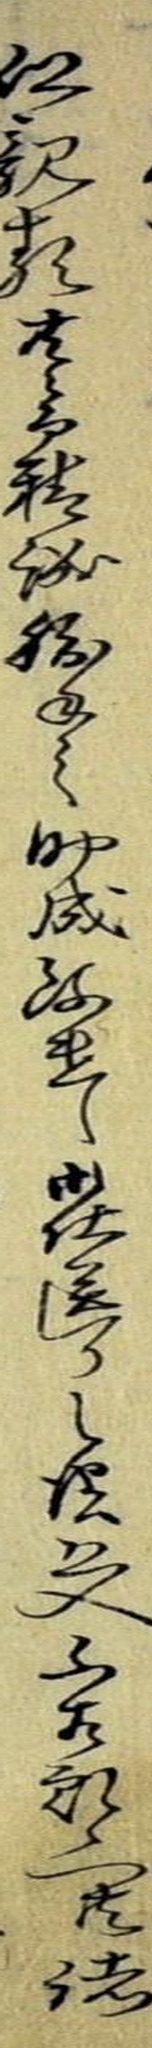但親類共に而精誠勝手之助成致遣し御仕送り之儀は恐入不相願候へ共諸
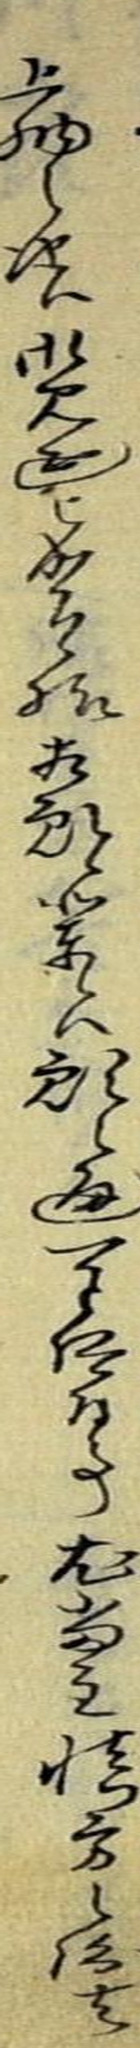上納之儀は御見延被成下候様相願候輩は願之通可被仰付事尤当主慎方之儀は
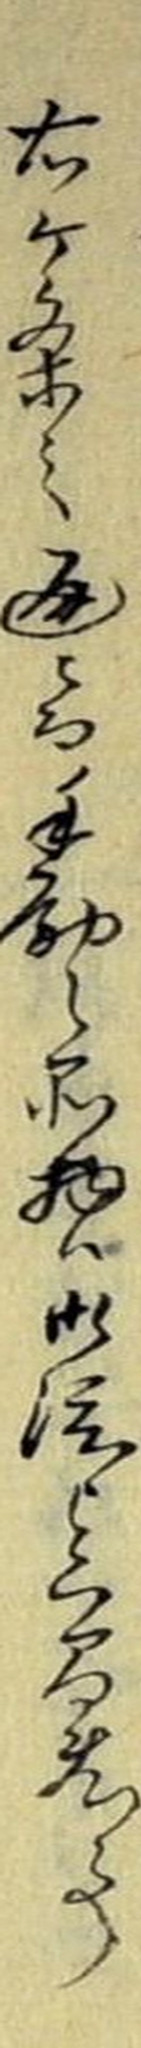右ヶ条之通に而手励？之品物は御渡被下間敷事
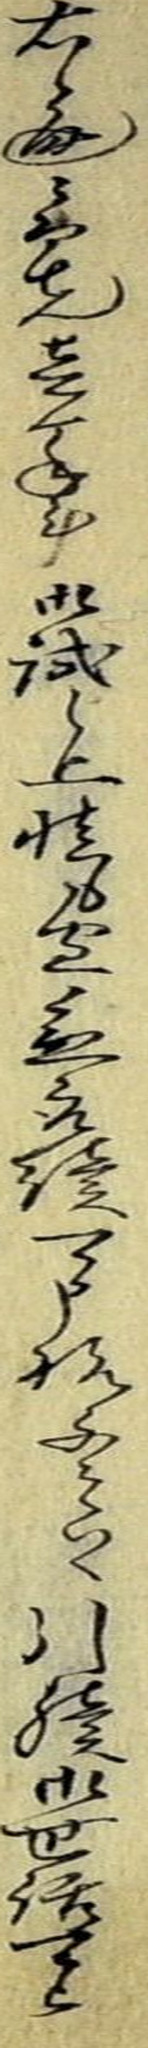右之通に而先壱ヶ年斗御試之上慎も宜愈取続可申様子に候はヽ引続御世話可被
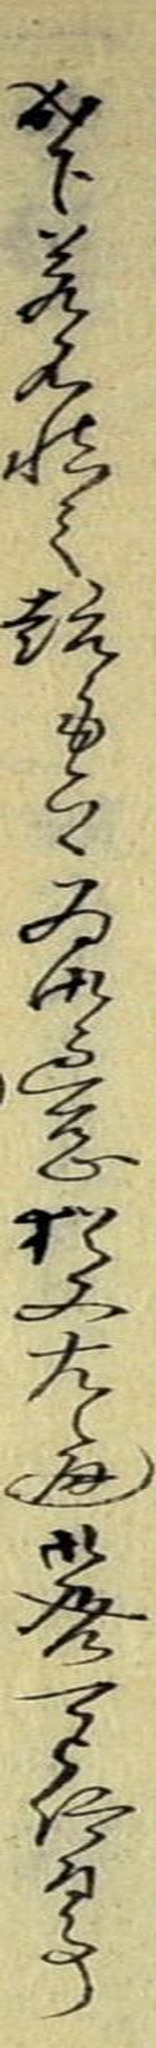成下若不慎之趣にも候はヽ為過怠猶又左之通御咎可被仰付事
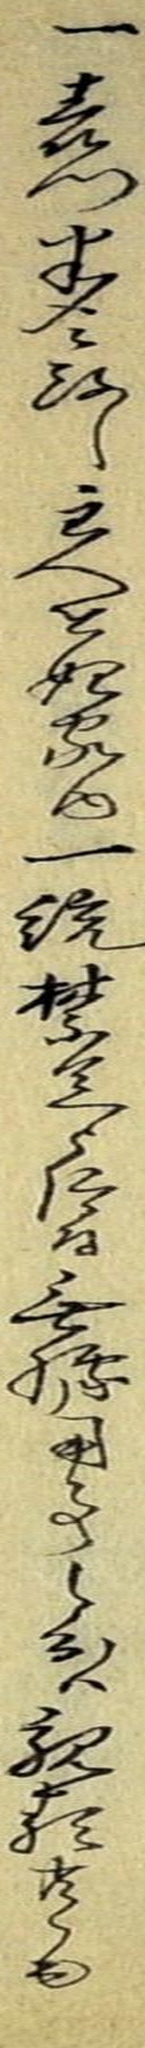一表門半〆に致し主人を始家内一統禁足被仰付無拠用事之分は親類共へも
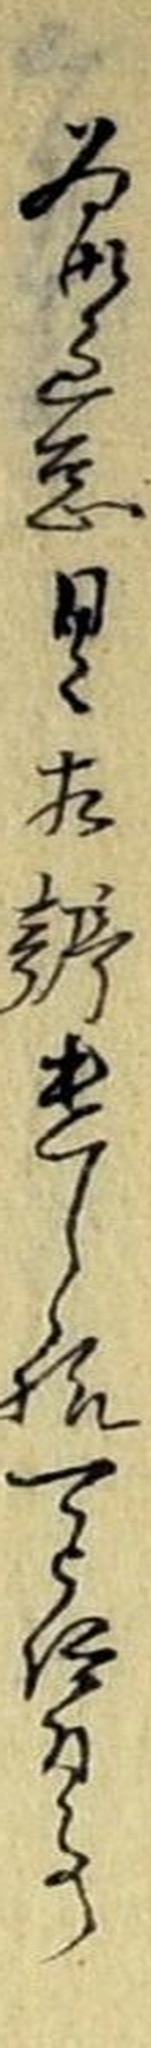為御過怠日々相弁遣し候様可被仰付事
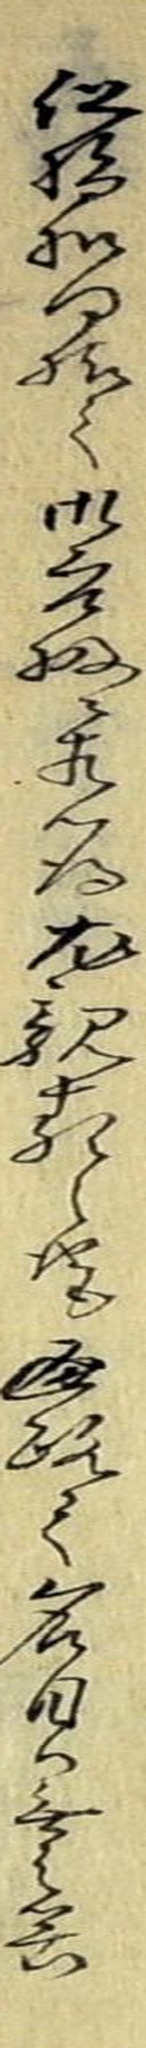但指扣同様之御取扱に相心得尤親類之儀も通路之名目は無之筈
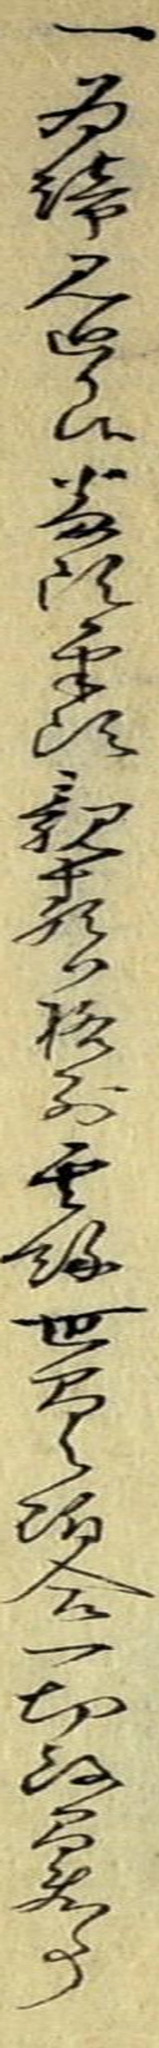一為締見廻り候番頭筆頭親類は格別其餘世間之附合一切致間敷事
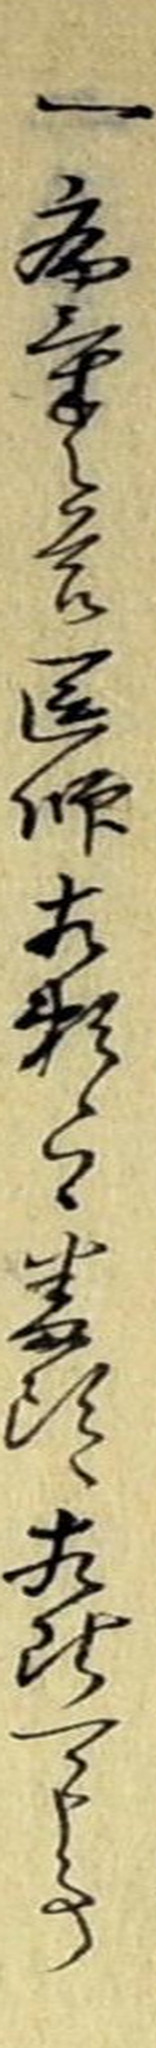一病気之節医師相頼候はヽ番頭へ相断可申事
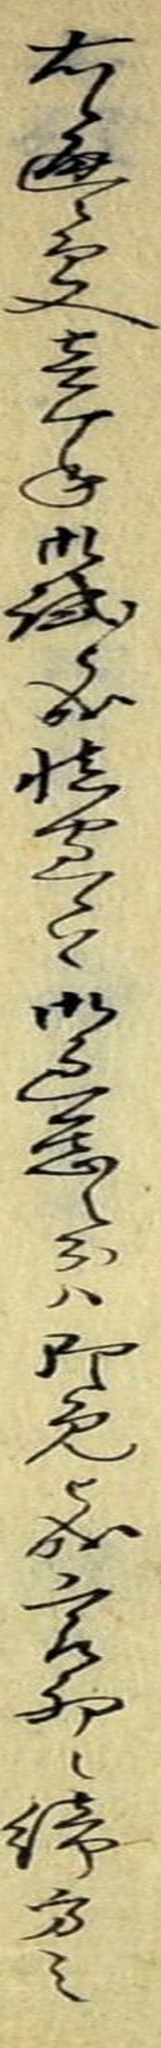右之通に而又一ケ年御試被成慎宜候はヽ御過怠之分は御免被成最初之締方之
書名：命令之部 六
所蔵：福井県文書館 Fukui Prefectural Archives
